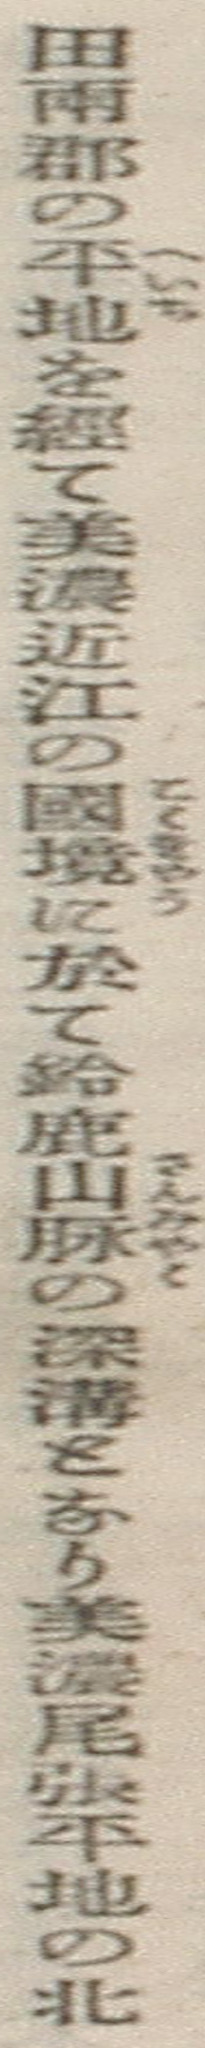田両郡の平地を経て美濃近江の国境に於て鈴鹿山脈の深溝となり美濃尾張平地の北
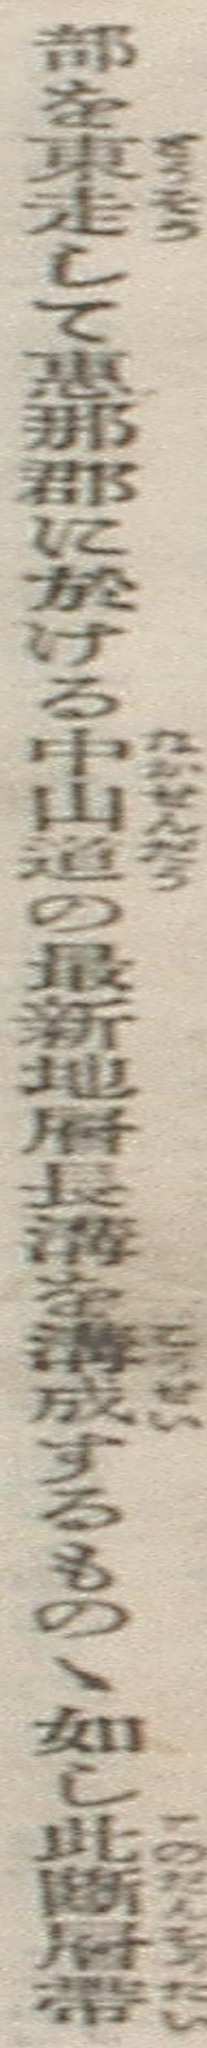部を東走して恵那郡に於ける中山道の最新地層長溝を溝成するものゝ如し此断層帯

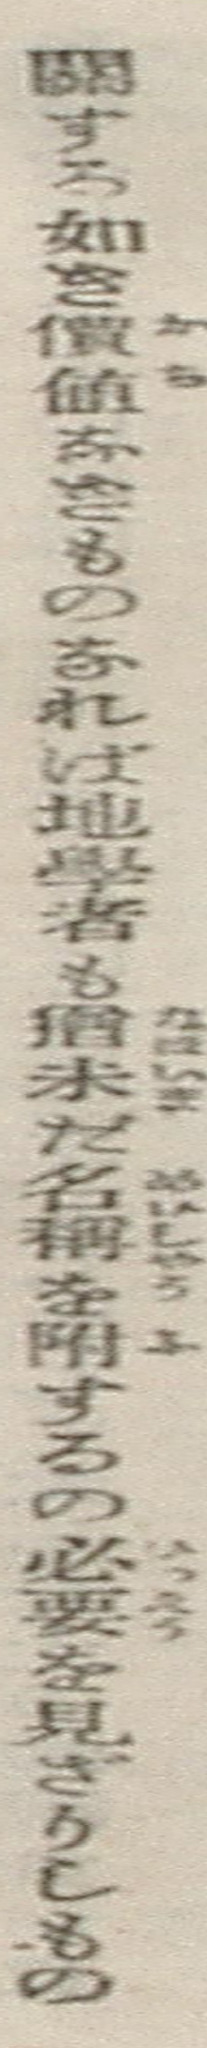関する如き価値なきものなれば地学者も猶未だ名称を附するの必要を見ざりしもの
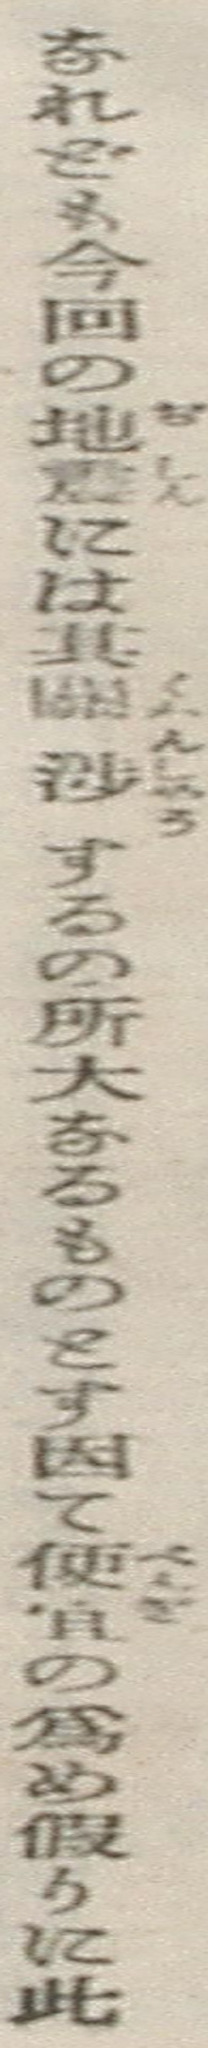なれども今回の地震には其関渉するの所大なるものとす因て便宜の為め仮りに此
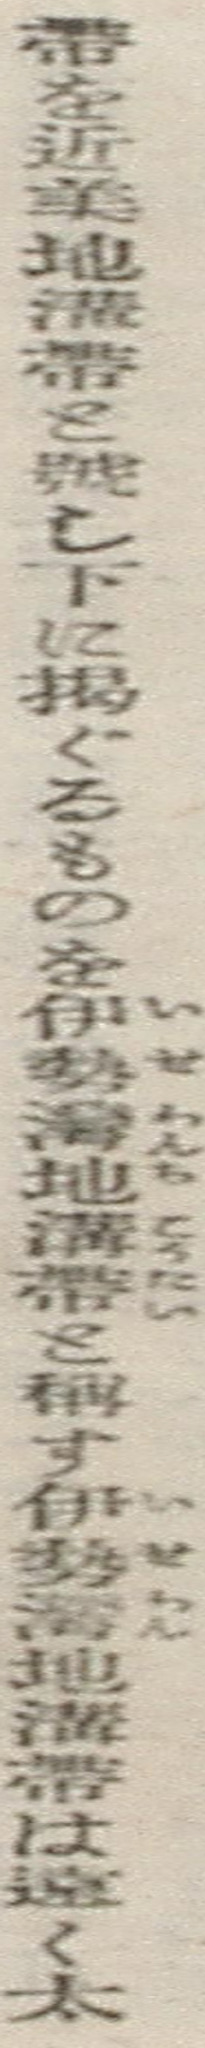帯を近美地溝帯と号し下に掲ぐるものを伊勢湾地溝帯と称す伊勢湾地溝帯は遠く太
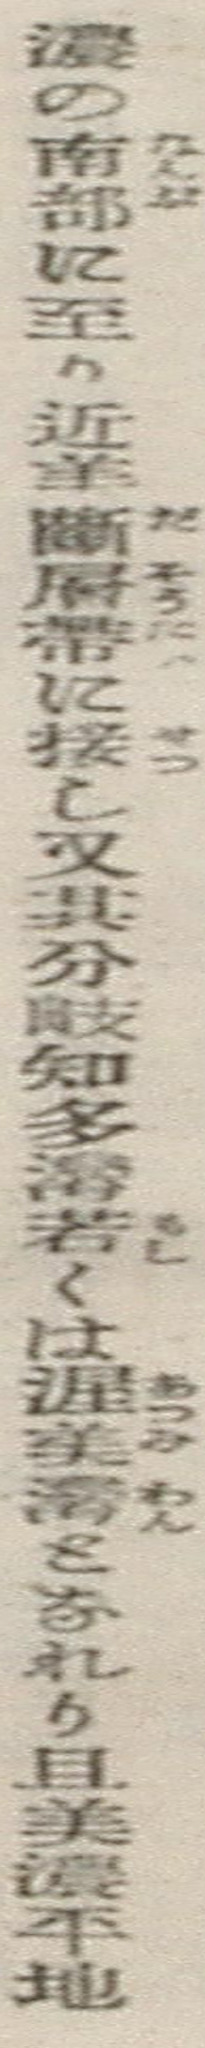濃の南部に至り近美断層帯に接し又其分岐知多湾若くは渥美湾となれり且美濃平地
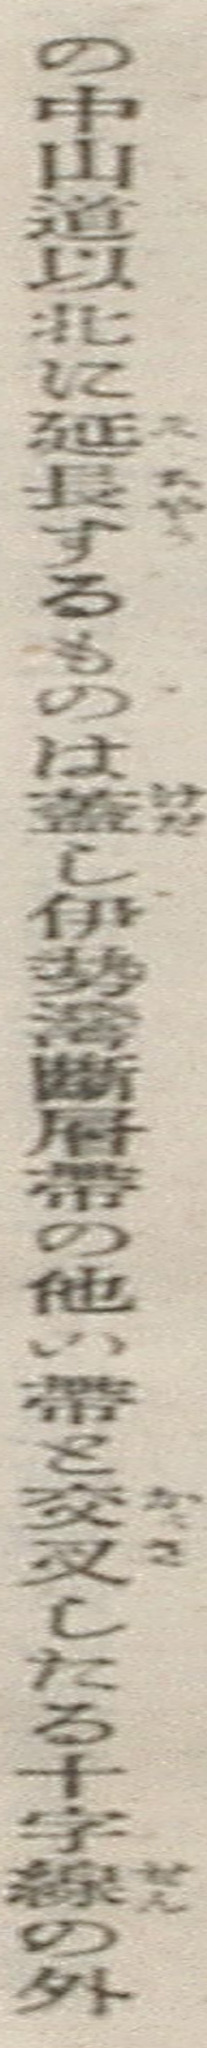の中山道以北に延長するものは蓋し伊勢湾断層帯の他の帯と交又したる十字線の外
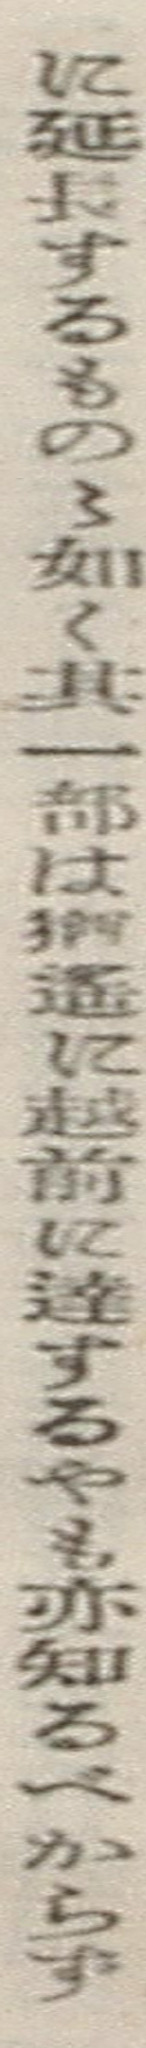に延長するもの〻如く其一部は猶遥に越前に達するやも亦知るべからず
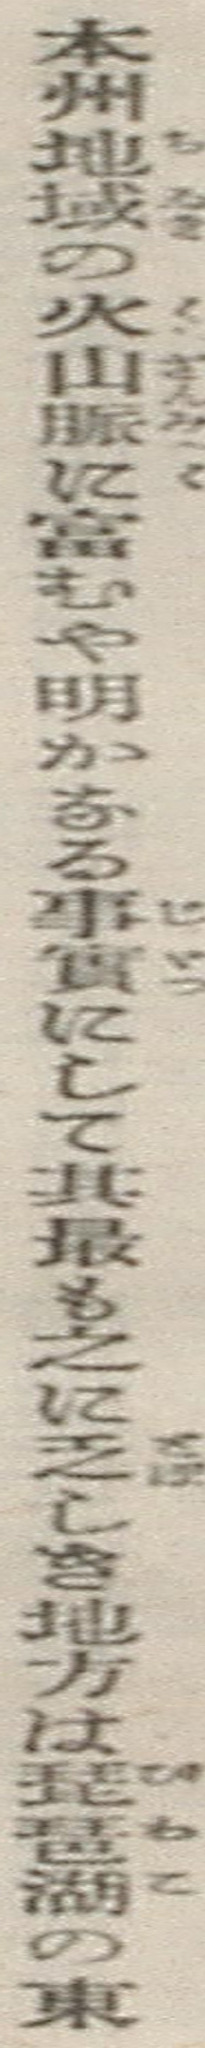本州地域の火山脈に富むや明かなる事実にして其最も之に乏しき地方は琵琶湖の東
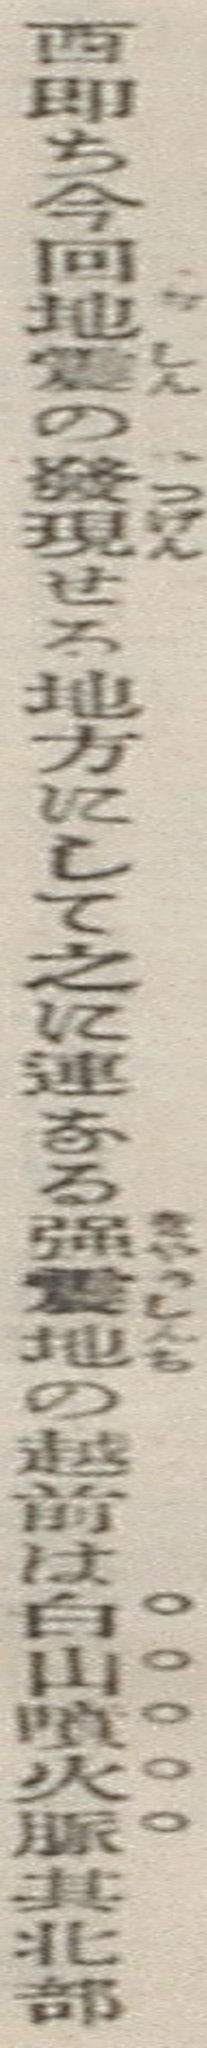西即ち今回地震の発現せる地方にして之に連なる強震地の越前は白山噴火脈其北部
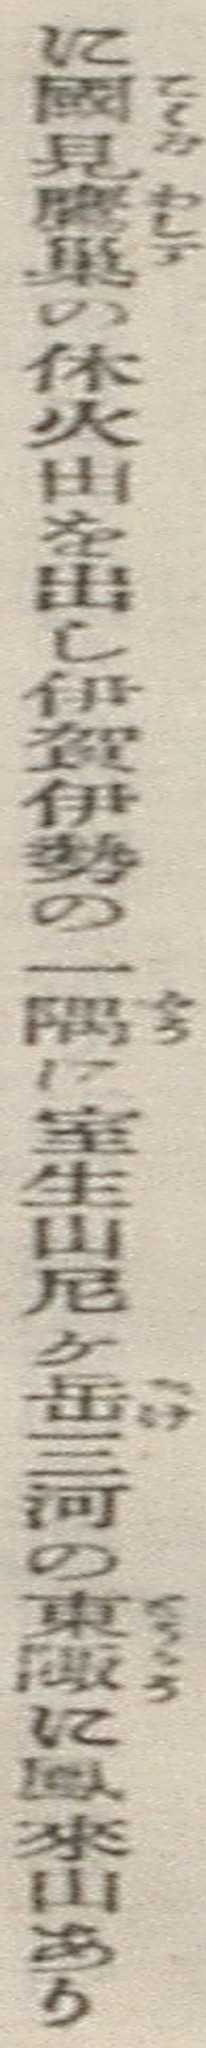に国見鷲巣の休火山を出し伊賀伊勢の一隅に室生山尼ケ岳三河の東陬に鳳来山あり
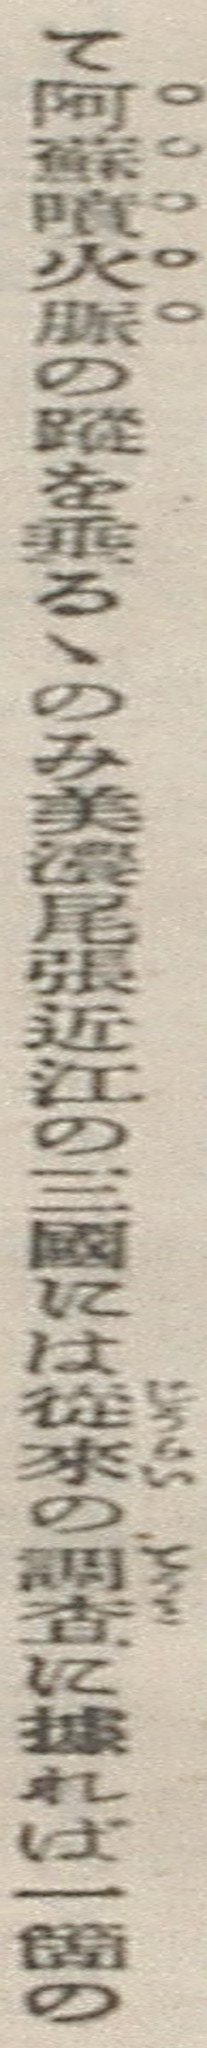て阿蘇噴火脈の蹝を垂るゝのみ美濃尾張近江の三国には従来の調査に拠れば一箇の
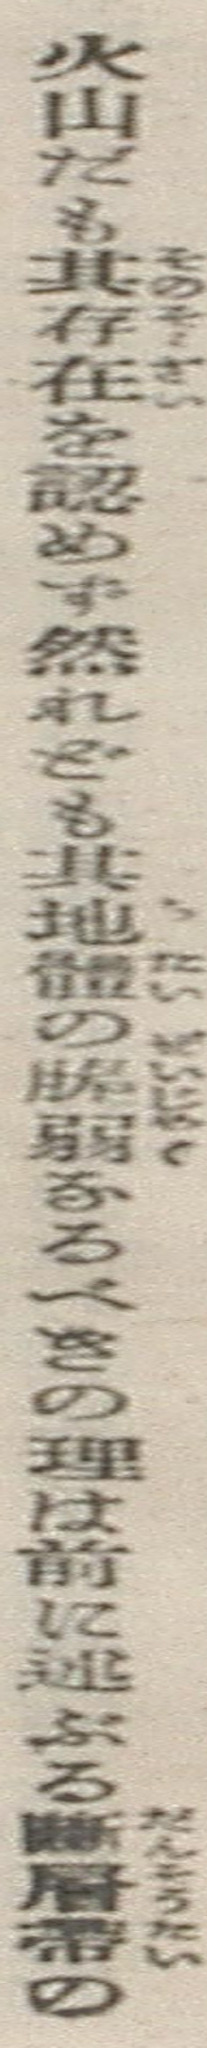火山だも其存在を認めず然れども其地體の脆弱なるべきの理は前に述ぶる断層帯の
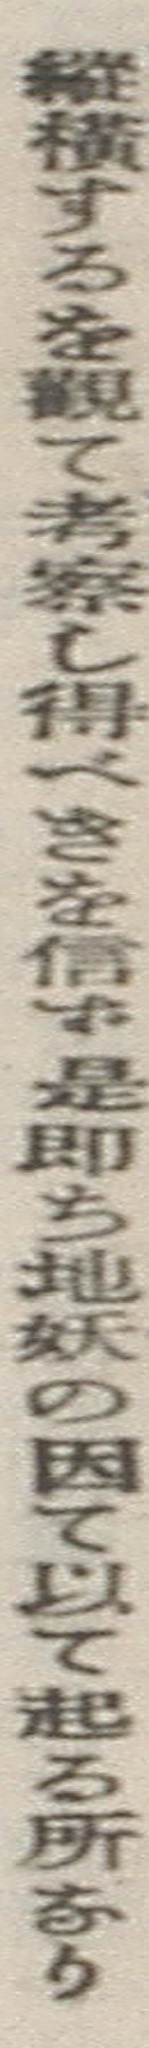縦横するを観て考察し得べきを信ず是即ち地妖の因て以て起る所なり
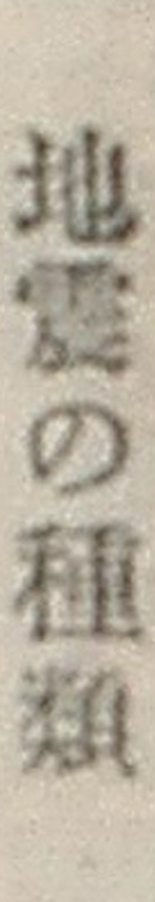地震の種類
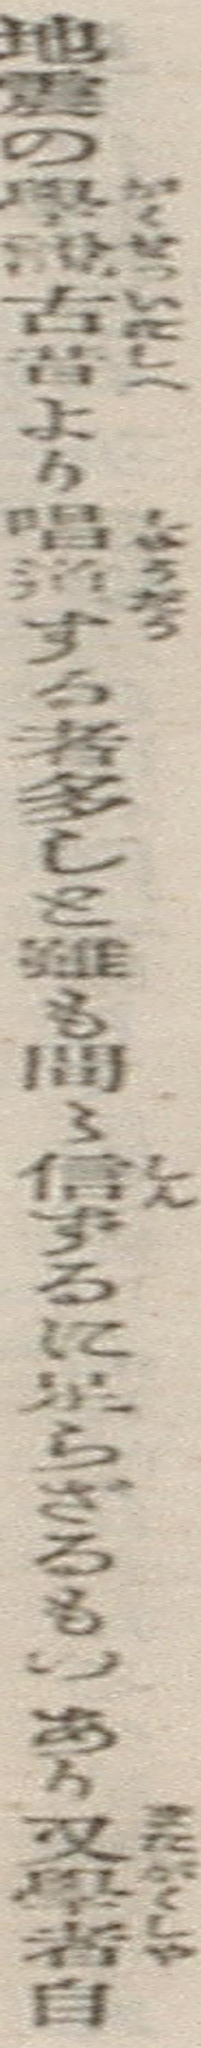地震の学説古昔より唱道する者多しと雖も間〻信ずるに足らざるものあり又学者自
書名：愛知岐阜福井三県　大地震見聞録（内題）
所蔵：東京大学地震研究所図書室 Earthquake Research Institute Library, The University of Tokyo, JAPAN
